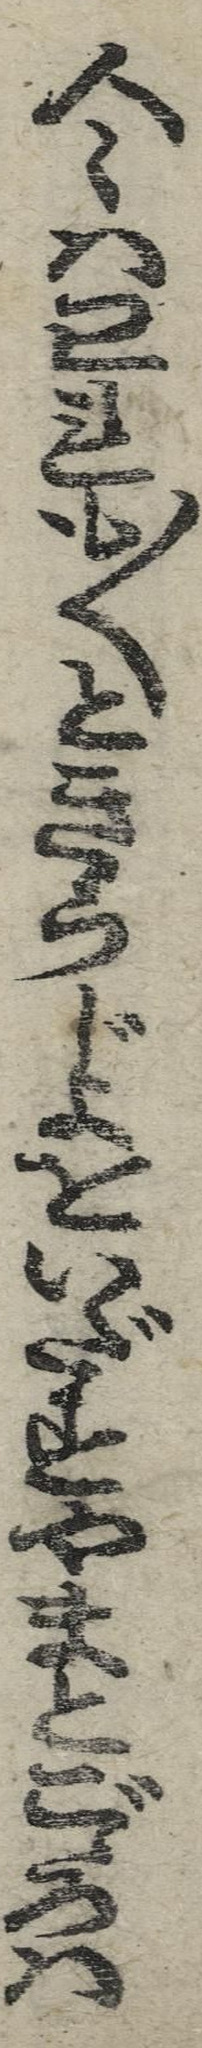人々はわれも〳〵ときうじよをいだすやまことごゝろは
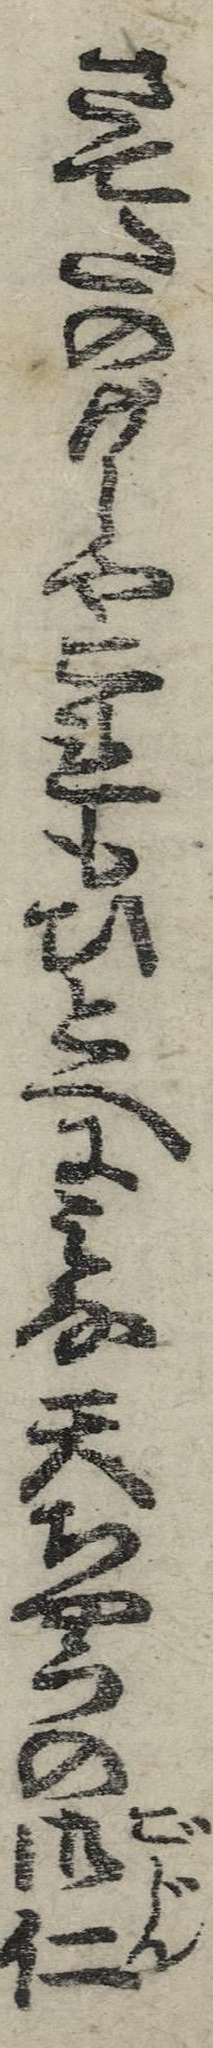さてたのもしやこれもひとへにみな天ちやうの御仁
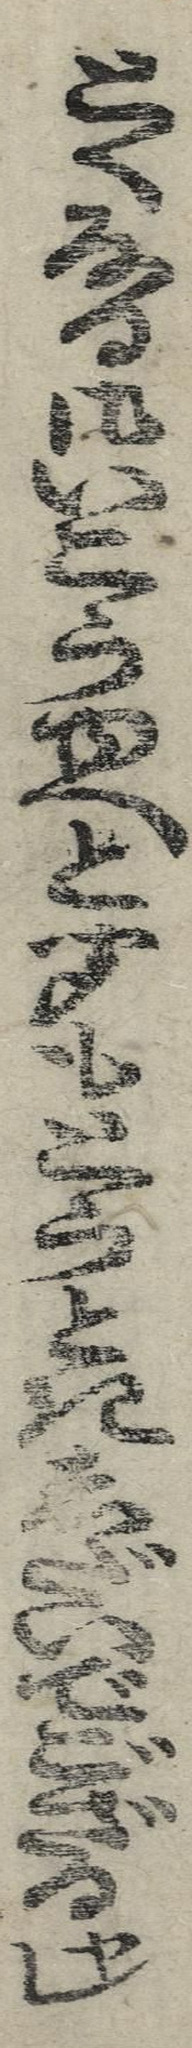とくなる御いこうゆへと聞もとうときしだいでござるヤレ
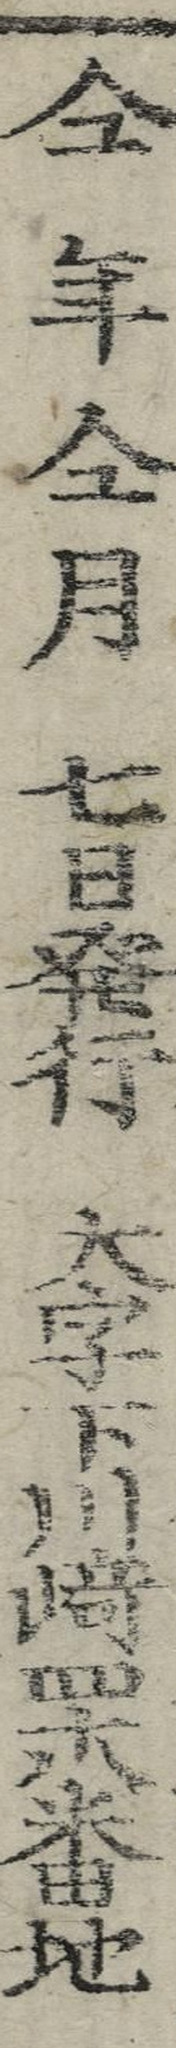同年同月七日発行大字下川崎四十八番地
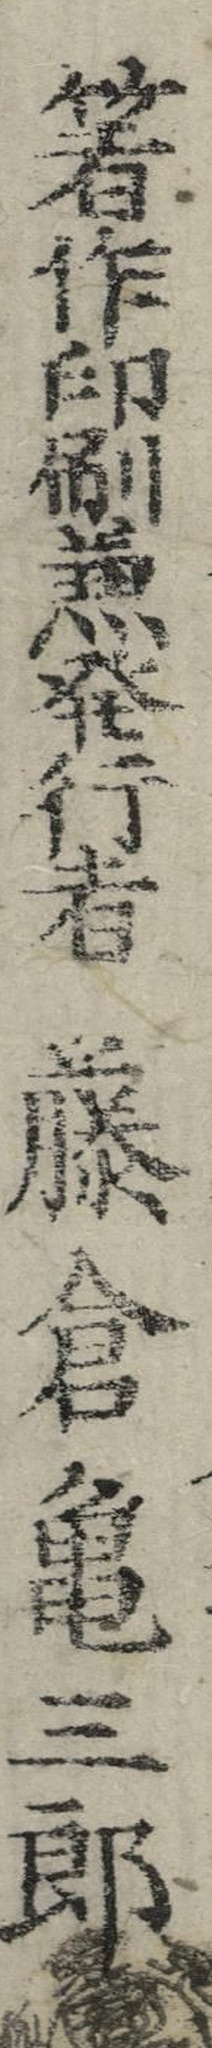著作印刷兼発行者藤倉亀三郎
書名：奥州すじ大つなみおおあれくどき
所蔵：東京大学地震研究所図書室 Earthquake Research Institute Library, The University of Tokyo, JAPAN
